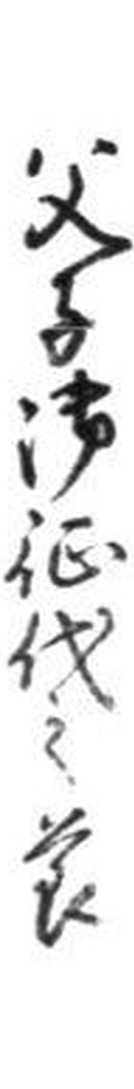父子御征伐之節
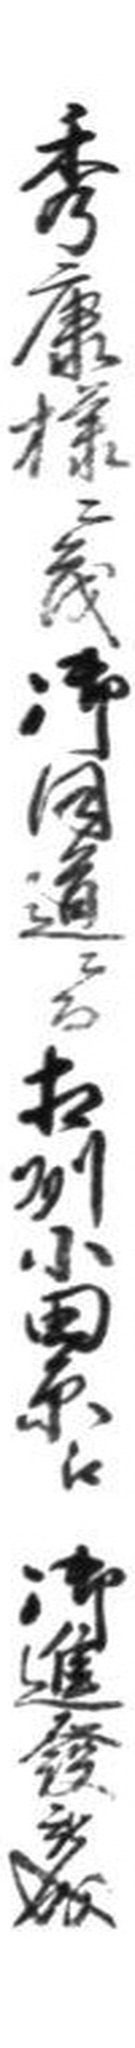秀康様ニ茂御同道ニ而相州小田原江御進発被成
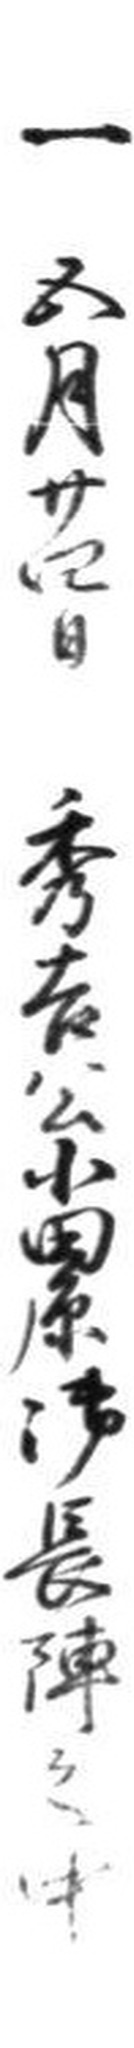一五月廿四日秀吉公小田原御長陣之中
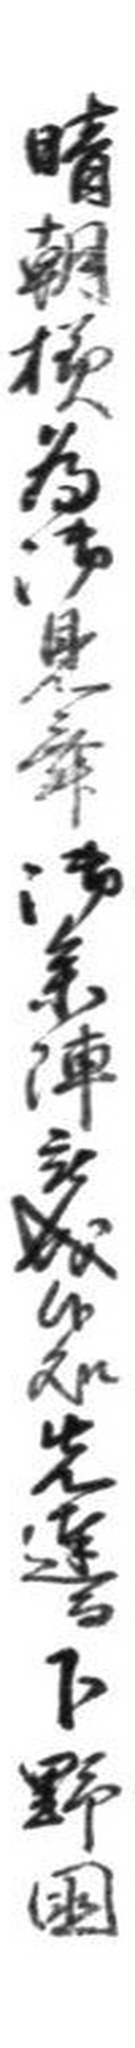晴朝様為御見舞御参陣被成候処先達而下野国
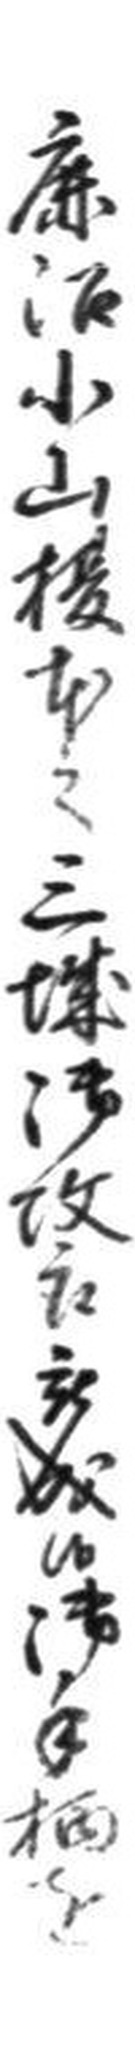鹿沼小山榎本之三城御攻取被成候御手柄を
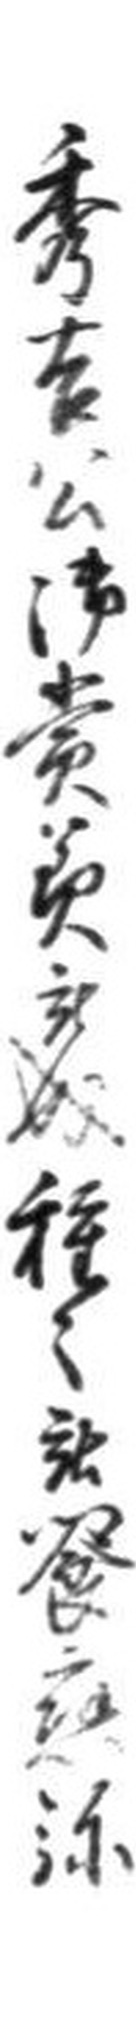秀吉公御賞美被成種々被饗応弥
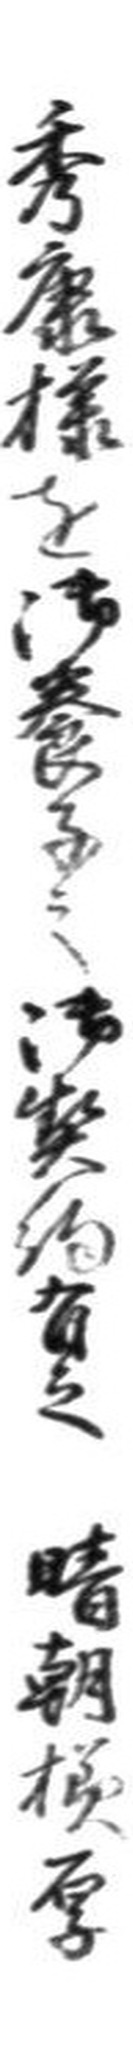秀康様を御養子之御契約有之晴朝様厚
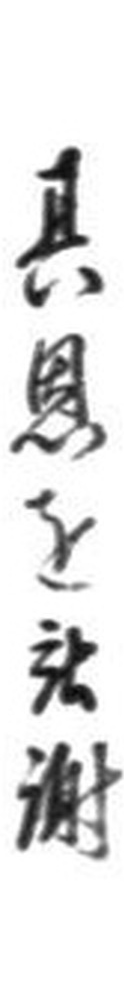其恩を被謝
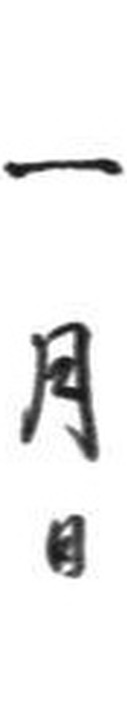一月日
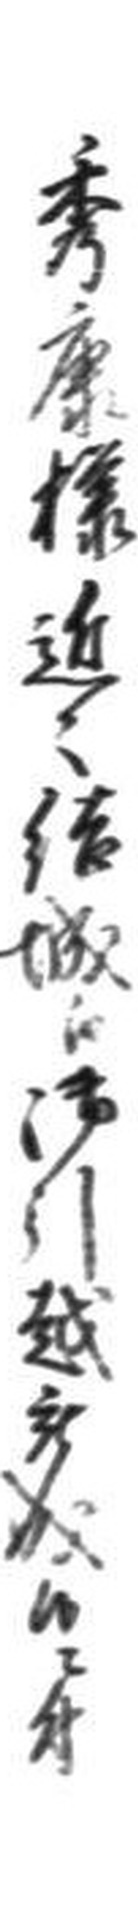秀康様近々結城江御引越被成候ニ付
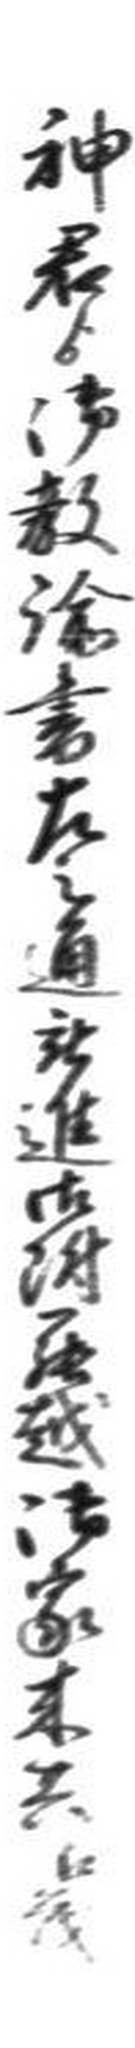神君ゟ御教諭書左之通被進御附罷越御家来共江も
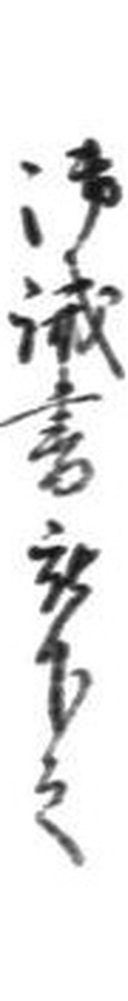御誡書被下之
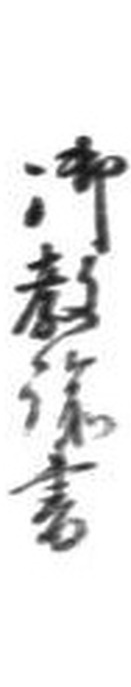御教諭書
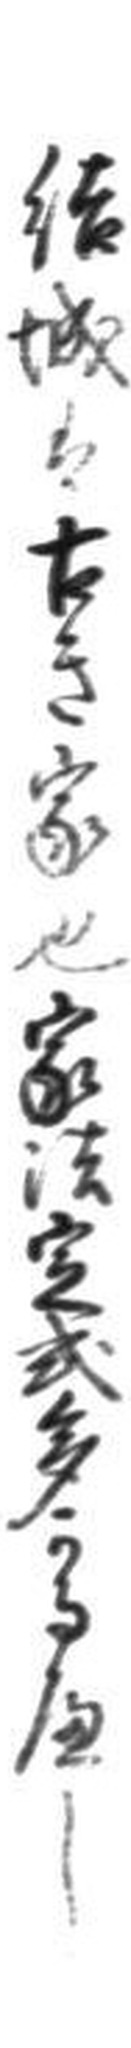結城は古き家也家法定式多かるへし
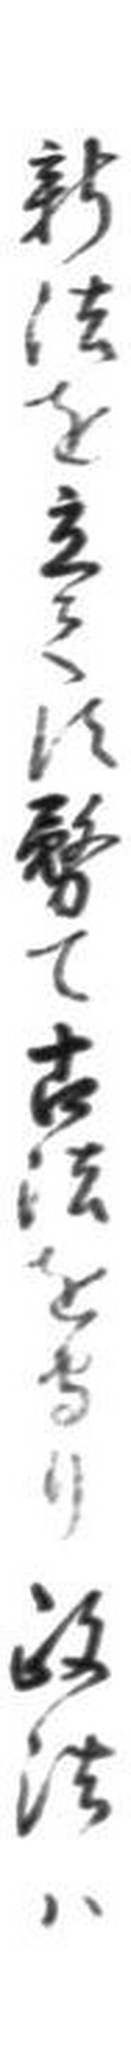新法を立てす務て古法を守り政法は
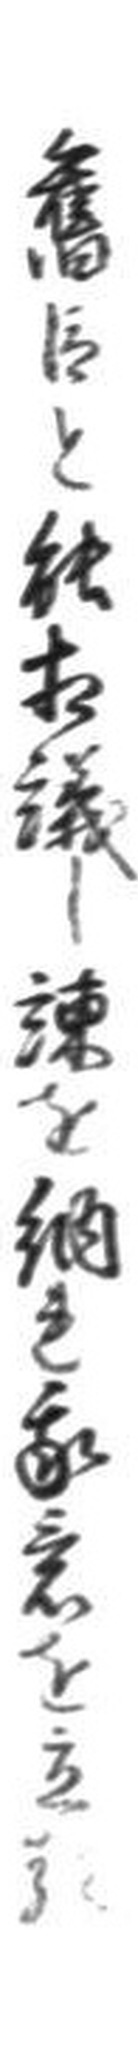旧臣と能相議し諫を納れ我意を立る
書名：家譜 一 秀康公 従天正二年到慶長十二年
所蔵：福井県文書館 Fukui Prefectural Archives
